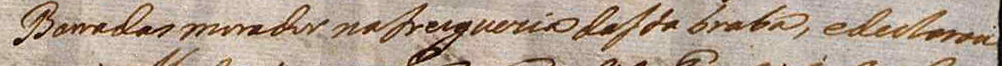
Barradas morador na freiguezia da Jtabraba, e declarou
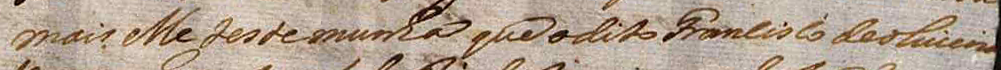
mais elle testemunha que o dito Francisco de oliueira
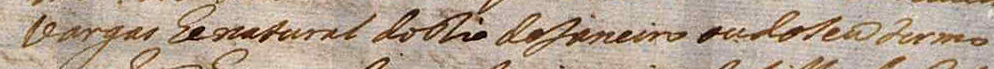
vargas he natural do Rio de Janeiro ou do seu termo
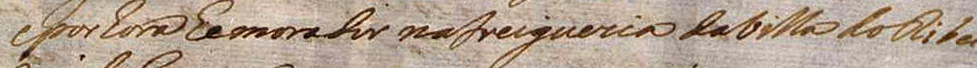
e por hora he morador na freiguezia da Villa do Ribei
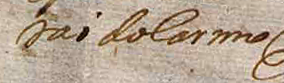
raõ do Carmo
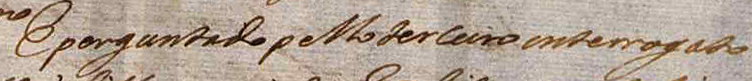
E perguntado pello terceiro interrogato
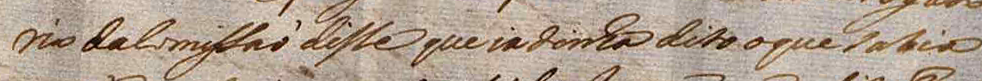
rio da Comissaõ disse que ia tinha dito o que sabia
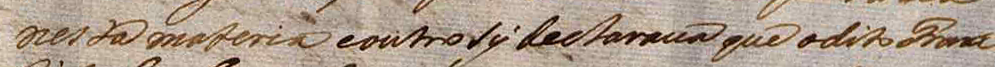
nesta materia e outrosy declaraua que o dito Fran
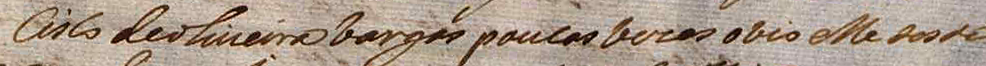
CisCo de oliueira vargas poucas vezes o vio elle teste
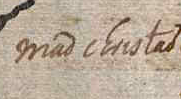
máo christaõ
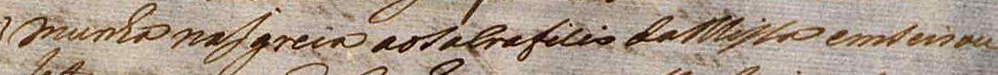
munha na Jgreia ao saCreficio da Missa em seis ou
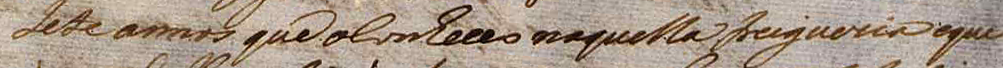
sete annos que o Conheceo naquella freguezia e que
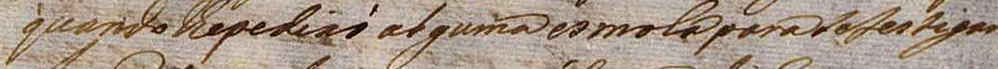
quando lhe pediaõ alguma esmola para se festigar
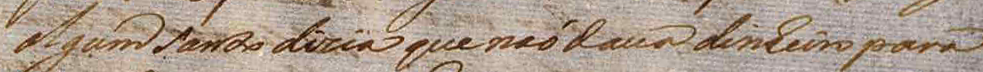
algum santo dizia que naõ daua dinheiro para
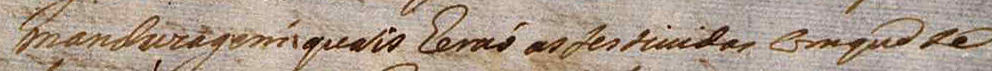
manduzagem quais heraõ as festiuidas com que se
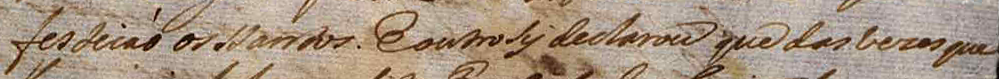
festeiaõ os ssantos. E outrosy declarou que das vezes que
